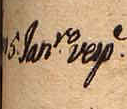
5 Ian.ro vesp.e
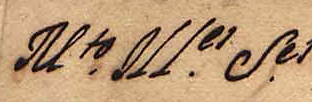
M.to Ill.es S.es
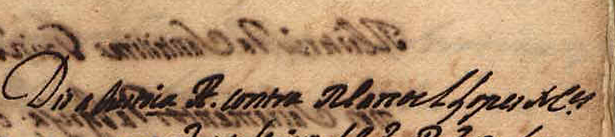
Dis a Iustiça A. contra Manoel Lopes M.es
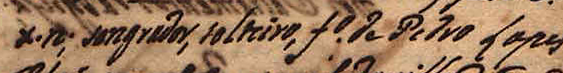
x. n., sangrador, solteiro, f.o de Pedro Lopes
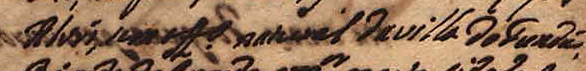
Alvrs̄, sem off.o natural da villa do Fundão,
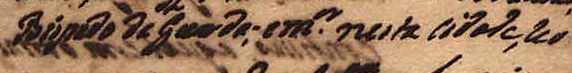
Bispado de Guarda; e m.or nesta cidade, reo
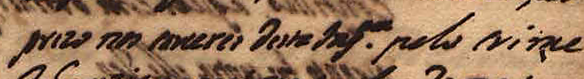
prezo nos carceres desta Inq.am pelo crime
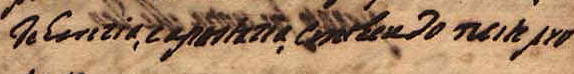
de herezia, e apostazia, contheudo neste pro
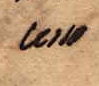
cesso
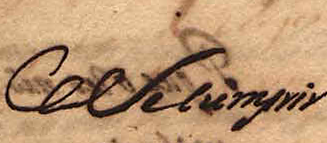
E Se cumpir
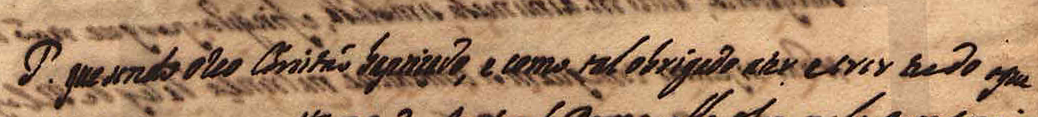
P. que sendo o Reo Christaõ baptizado, e como tal obrigado a ter e crer tudo a que
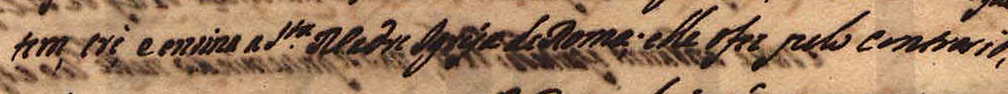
tem, cre, e ensina a s.ta Madre Igreja de Roma: elle o fez pelo contrario,
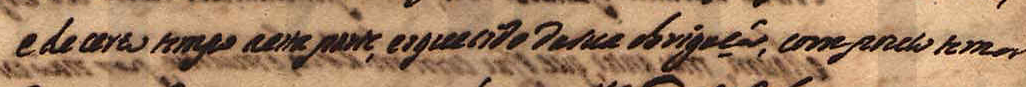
e de certo tempo a esta parte, esquecido de sua obrigação, com pouco temor
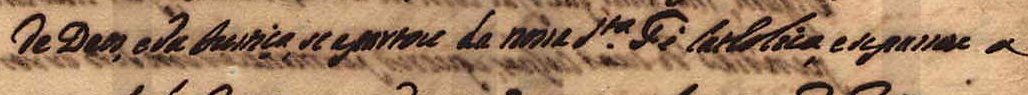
de Deos, e da Iustiça se apartou da nossa S.ta Fé Catholica, e se passou a
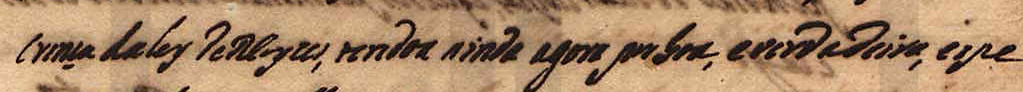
crença da ley de Moyzes, tendoa ainda agora por boa, e verdadeira, espe
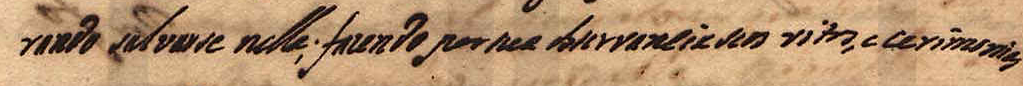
rando salvarse nella; fazendo por sua observancia seos ritos, e cerimonias
